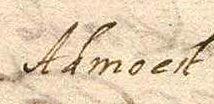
Admoest
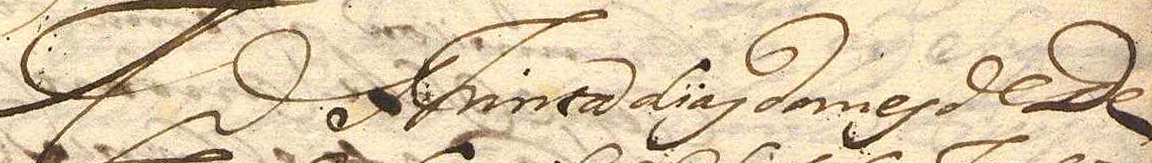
Aos trinta dias do mes de De
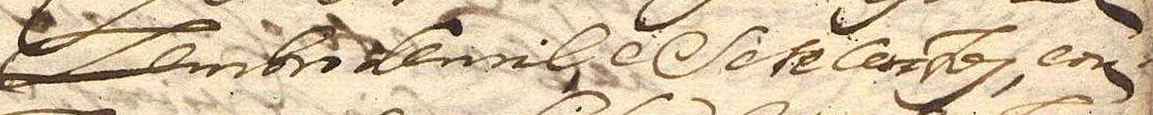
Zembro de mil, e Setecentos, e on
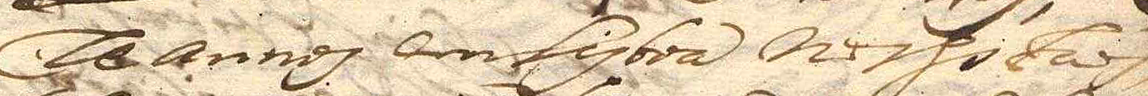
Ze annos em lisboa nos estaos,
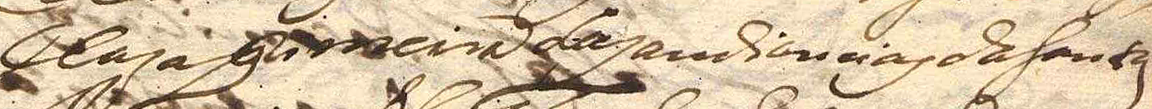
e caza primeira das audiencias da santa
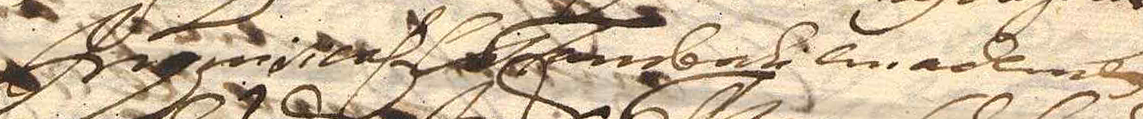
Jnquisiçaõ Estando ahi em a de me
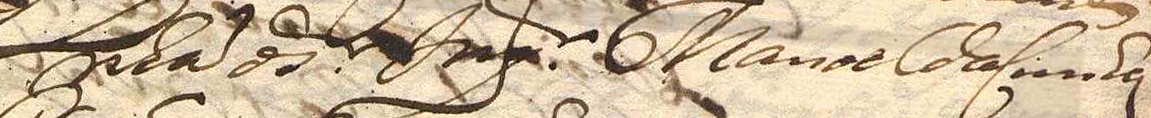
nhã o s.or Inq.or. Manoel da Cunha
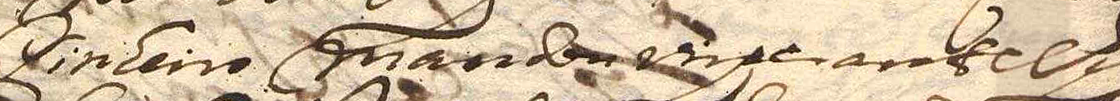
Pinheiro mandou vir perante sy
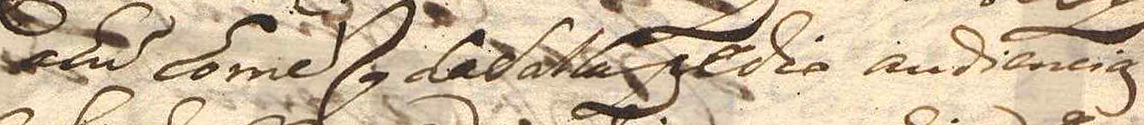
a hū homē q̄ da Salla pedio audiencia
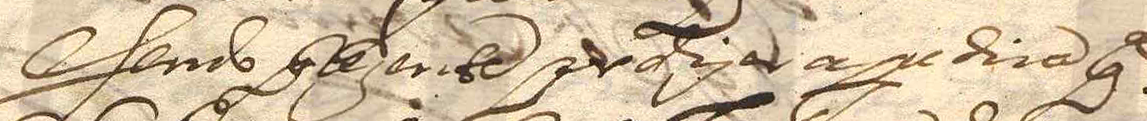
E sendo prezente por dizer a pedira p̄.a
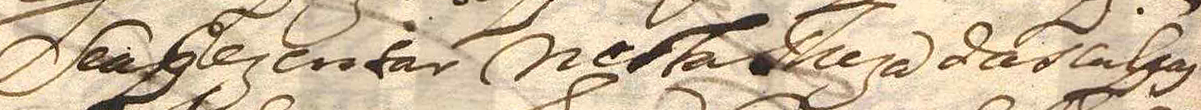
se aprezentar nesta Meza das culpas
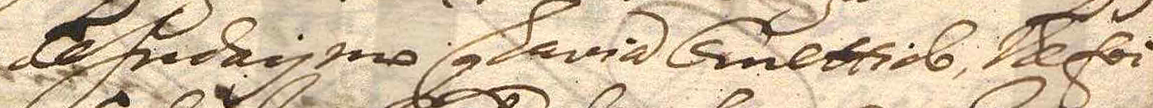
de Judaismo q̄ havia Comettido, lhe foi
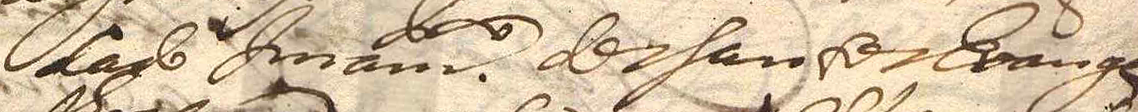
dado Iuram.to dos santos Evange
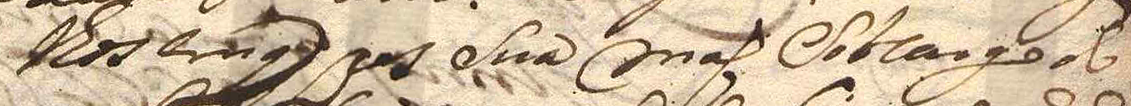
lhos em q̄ pos sua maõ Sob cargo do
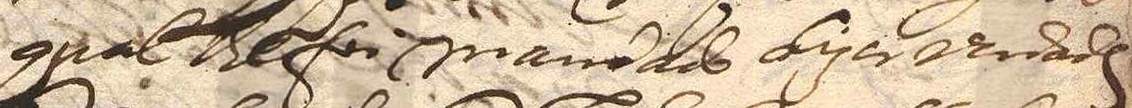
qual lhe foi mandado dizer verdade
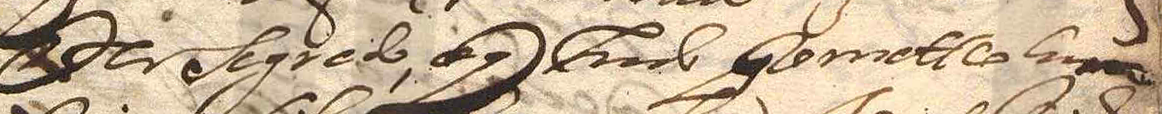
E ter segredo, o q̄ tudo prometteo cum
